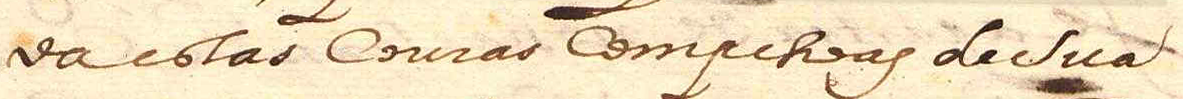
va estas Couzas Com pessoas de sua
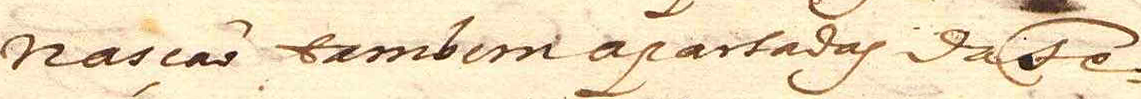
nasçaõ tambem apartadas da Fe
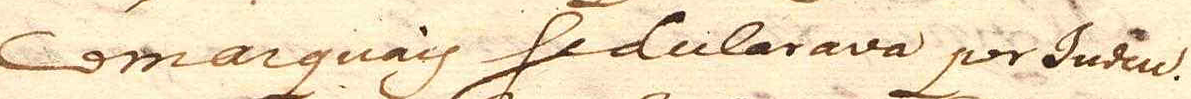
Com as quais se declarava por Iudeu.
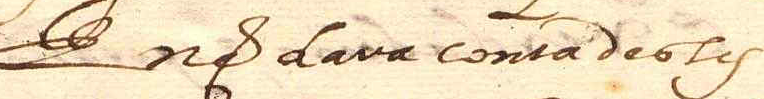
E naõ dava conta destes
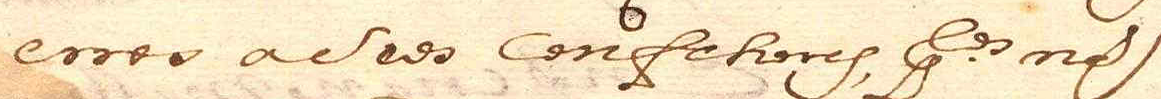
erros a seos confesores, p.los naõ
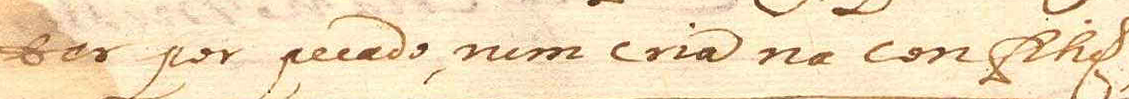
ter por pecado, nem cria na confissaõ,
